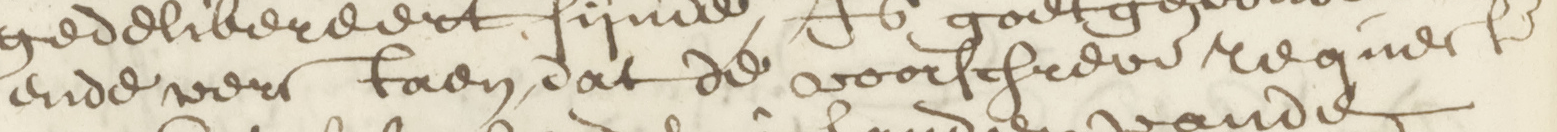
ende verstaen, dat de voorschreve requeste
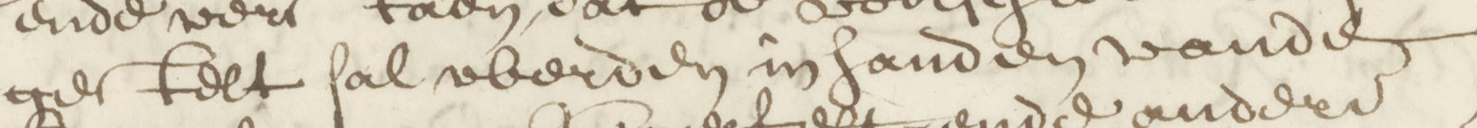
gestelt sal werden in handen vande
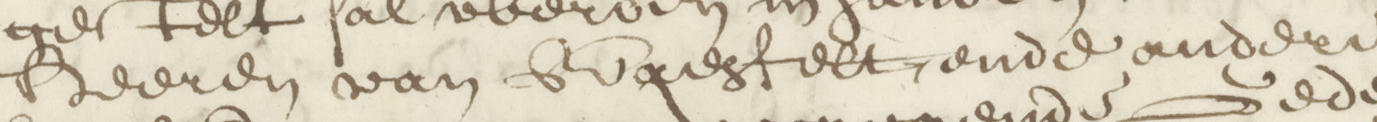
Heeren van Raesfelt, ende andere
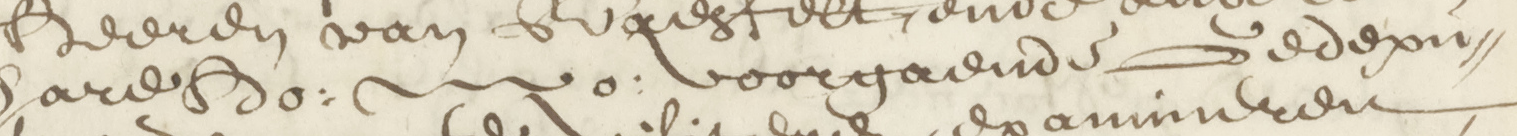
hare Ho:Mo: voorgaende Gedepu„
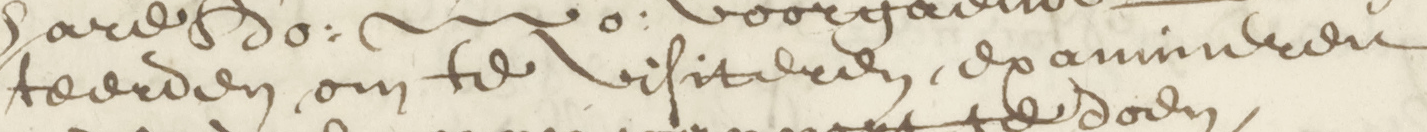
teerden, om te visiteren, examineren
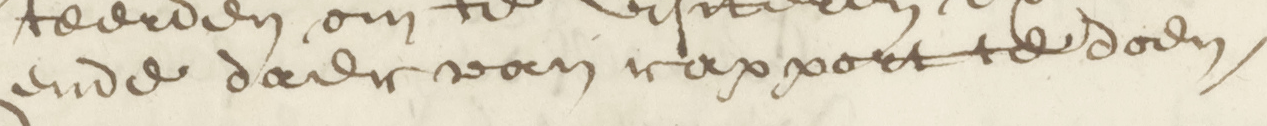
ende daer van rapport te doen.
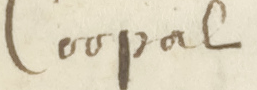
Coopal
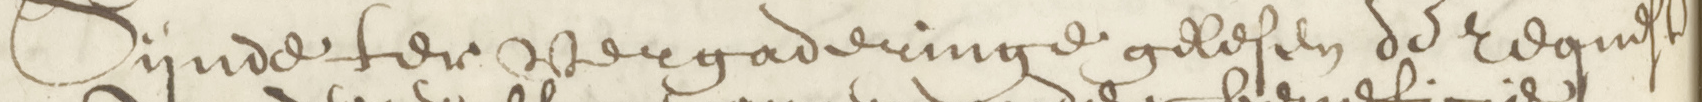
Sijnde ter Vergaderinge gelesen de requeste
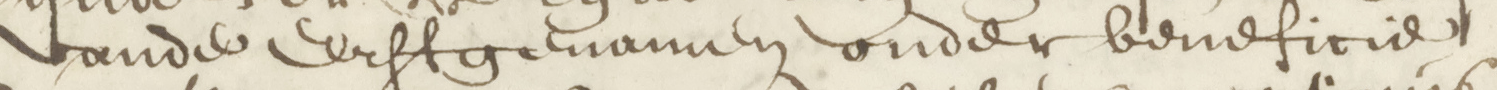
vande Erffgenamen onder beneficie
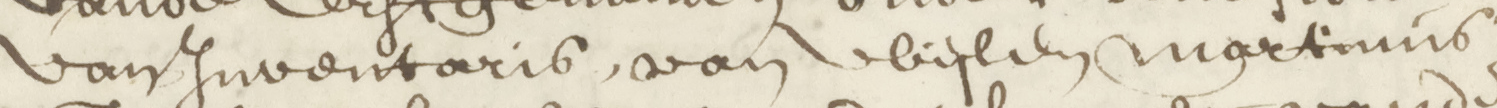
van Inventaris, van wijlen Martinus
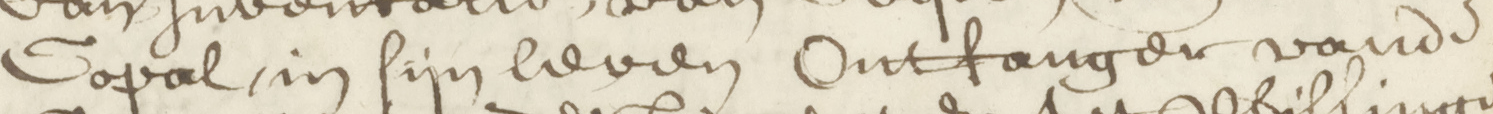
Copal, in sijn leven Ontfanger vande
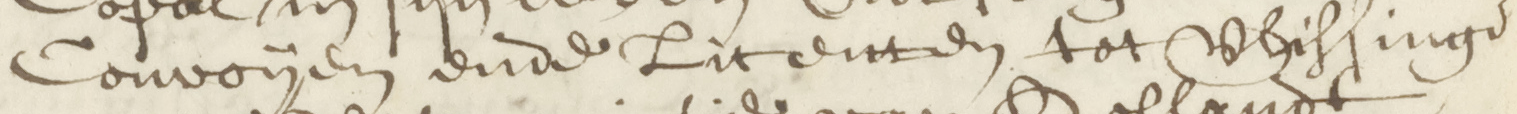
Convoijen ende Licenten tot Vlissinge
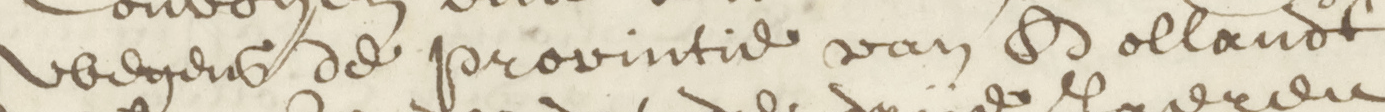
wegens de provintie van Hollandt,
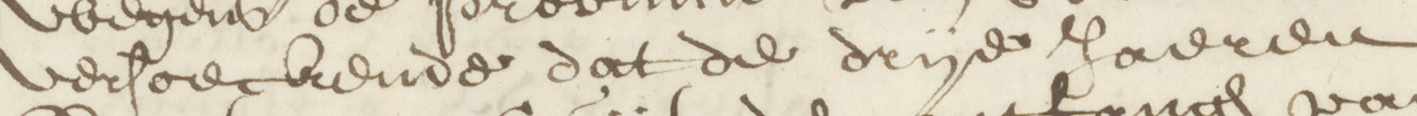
versoeckende dat de drije Jaeren
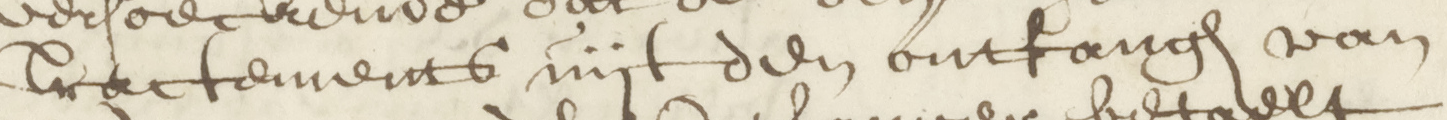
Tractements uijt den ontfangh van
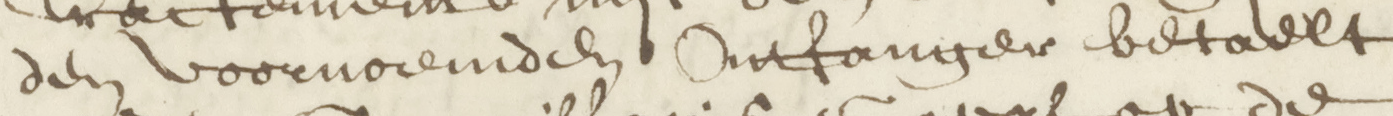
den voornoemden Ontfanger betaelt
